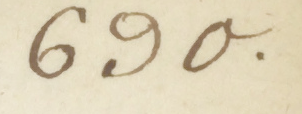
690.
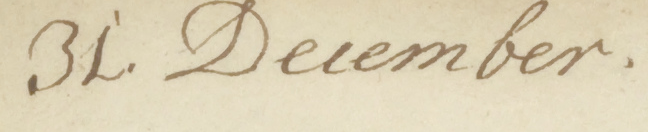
31. December.
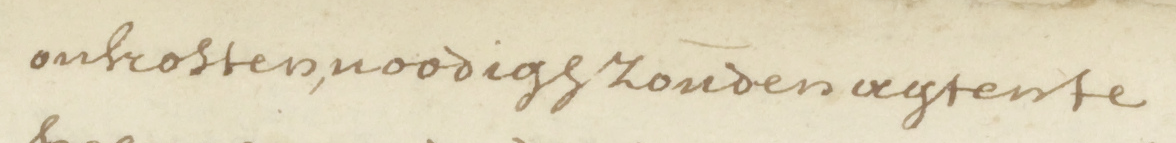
onkosten noodigh zouden agten te
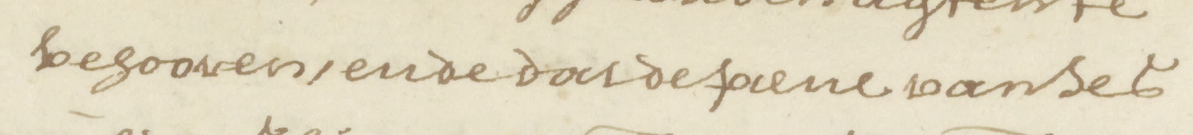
behooren, ende dat de pene van ses
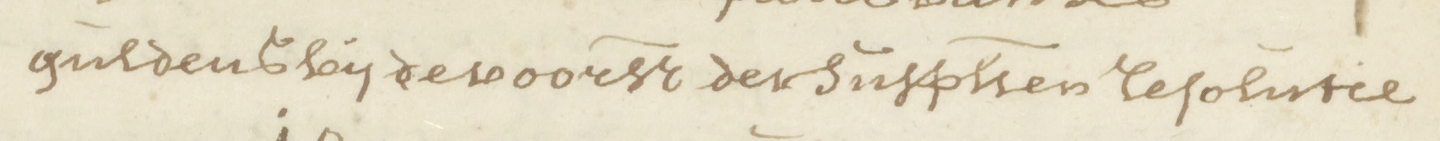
guldens bij de voorsz der supplten resolutie
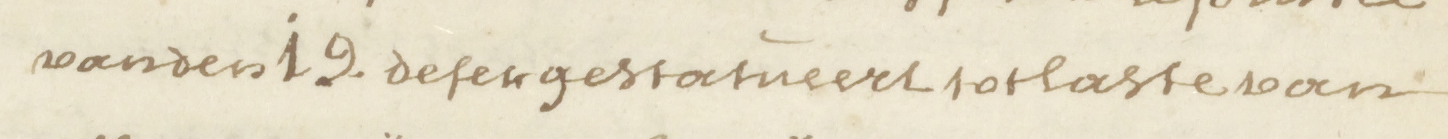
vanden 19. deser gestatueert tot laste van
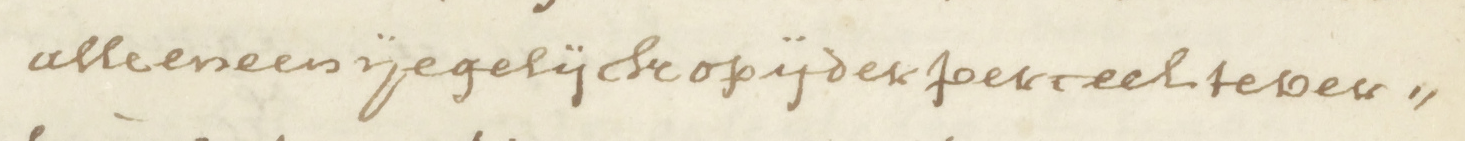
alle en een ijegelijck opijder perceel te ver„
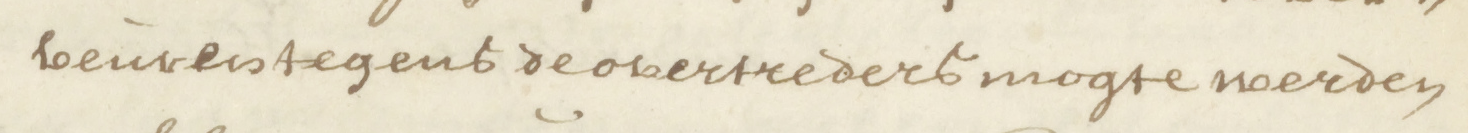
beuren tegens de overtreders mogte werden
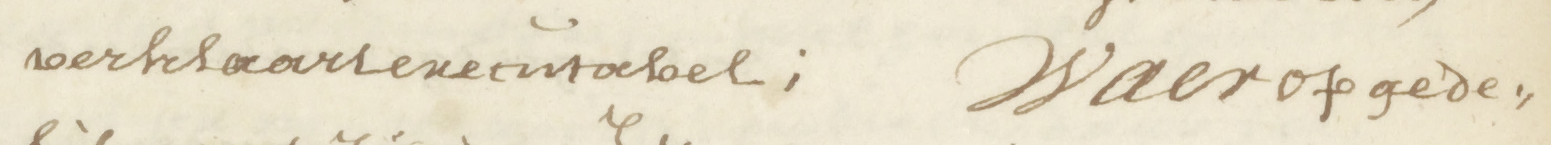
verklaart executabel: Waerop gede„
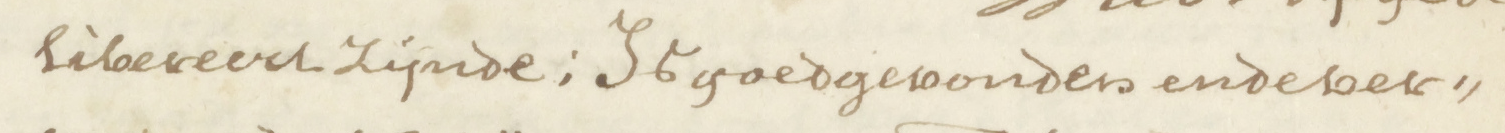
libereert zijnde: Is goedgevonden ende ver„
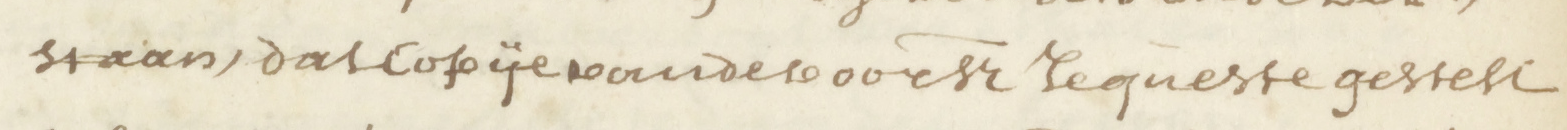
staan, dat copije vande voorsz requeste gestelt
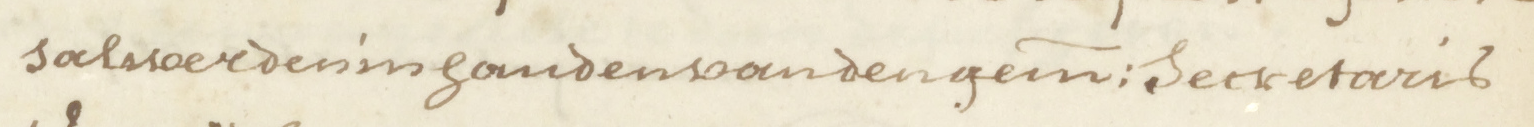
sal werden in handen vanden gem: secretaris
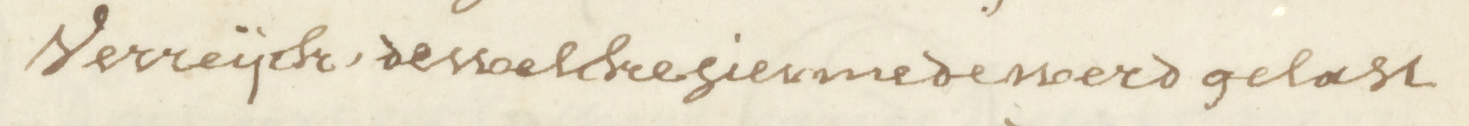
Verreijck, de welcke hiermede werd gelast
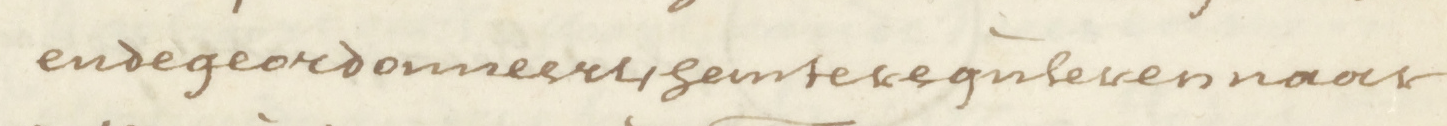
ende geordonneert, hem te reguleren naar
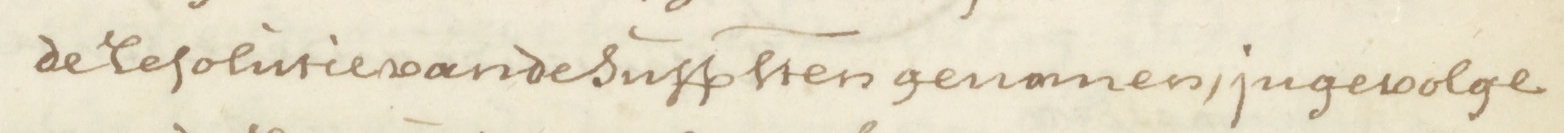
de resolutie vande supplten genomen, ingevolge
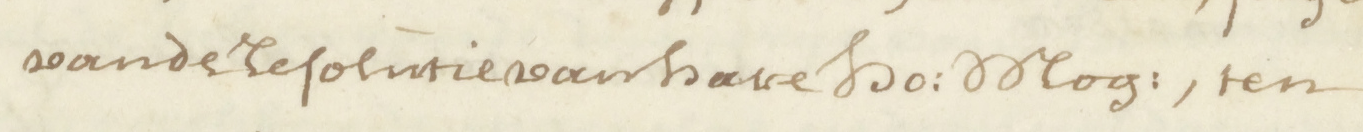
vande resolutie van hare Ho:Mog:, ten
